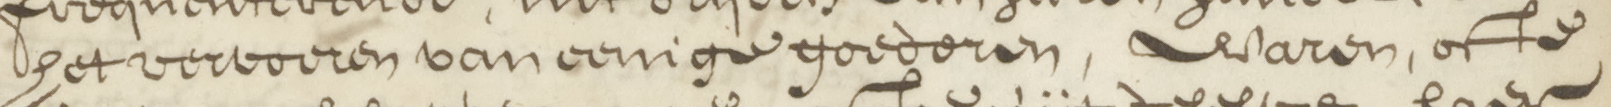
het vervoeren van eenige goederen, Waren, ofte
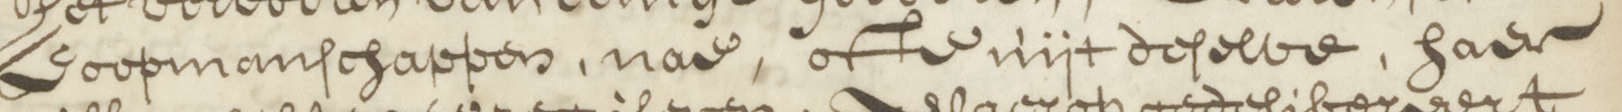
Coopmanschappen, nae, ofte uijt deselve, haer
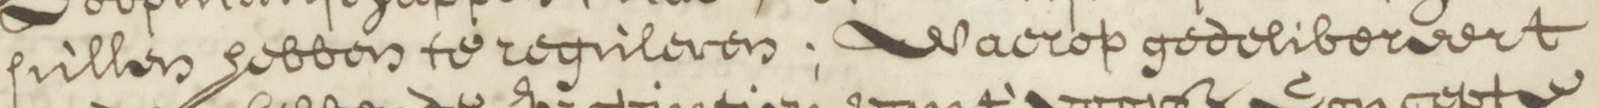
sullen hebben te reguleren; Waerop gedelibereert
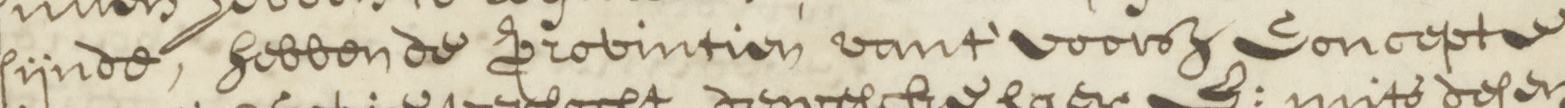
sijnde, hebben de Provintien vant' voorsz Concepte
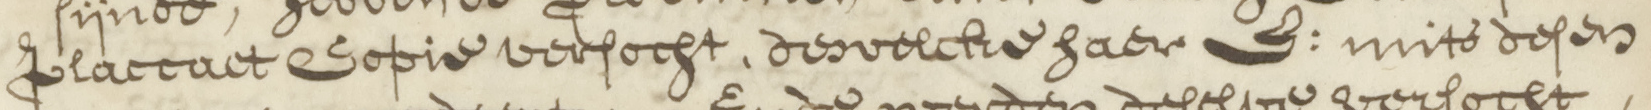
Placcaet Copie versocht, deswelcke haer E: mits desen
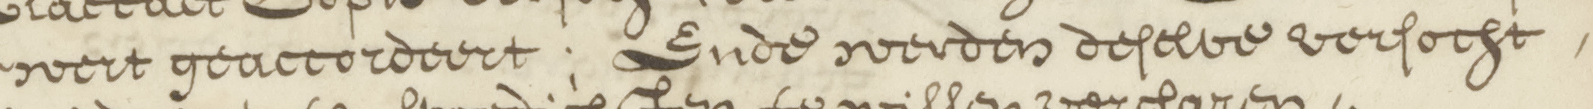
wert geaccordeert; Ende werden deselve versocht,
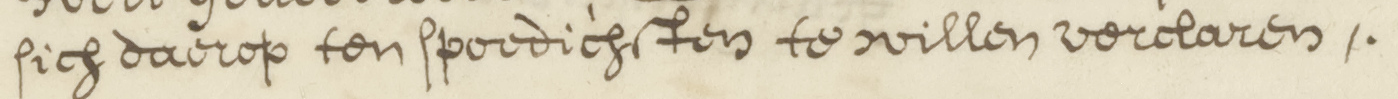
sich daerop ten spoedichsten te willen verclaren.
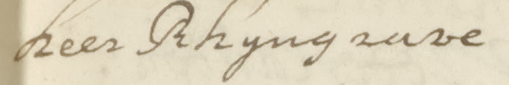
heer Rhyngrave
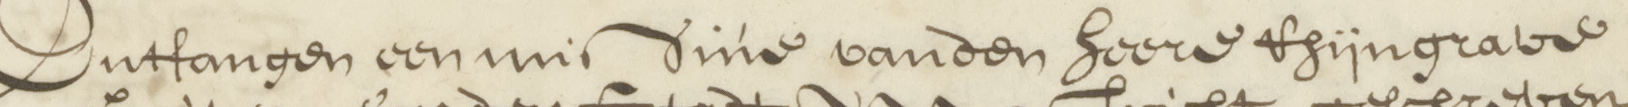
Ontfangen een missiue vanden heere Rhijngrave,
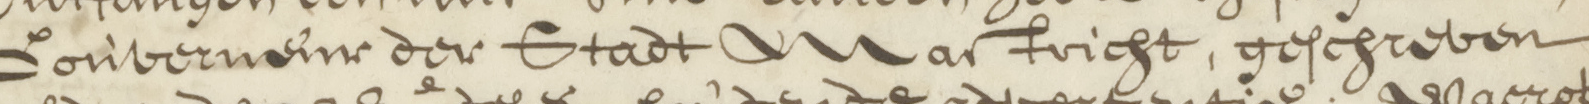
Gouverneur der Stadt Mastricht, geschreven
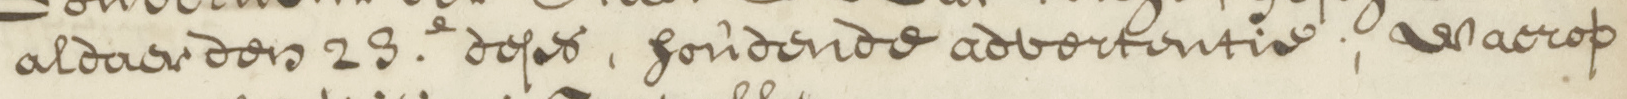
aldaer den 23.e deses, houdende advertentie; Waerop
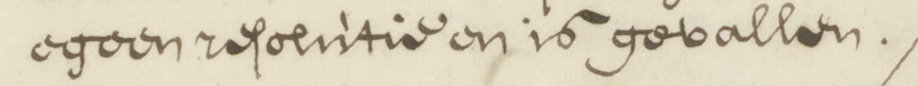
egeen resolutie en is gevallen.
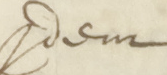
Idem
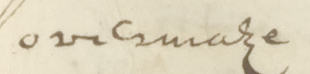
overmaze
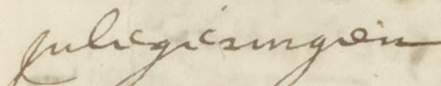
Inlegeringen
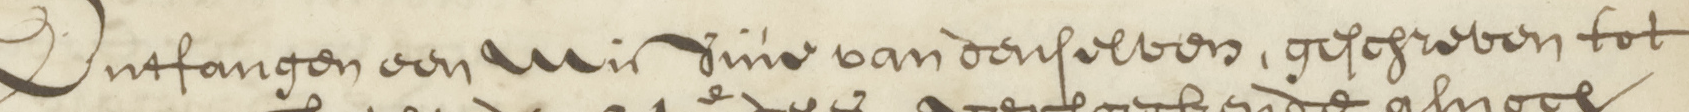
Ontfangen een Missiue van denselven, geschreven tot
